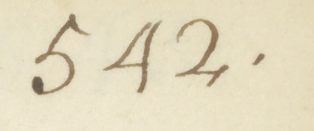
542.
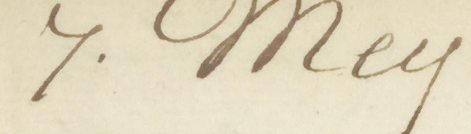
7. Meij
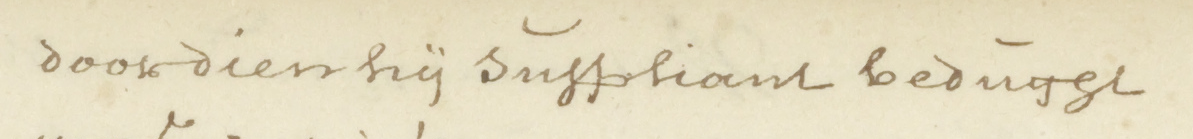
door dien hij suppliant bedught
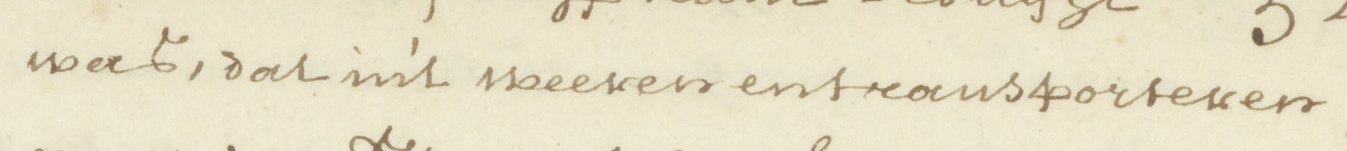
was, dat in't weeren entransporteren
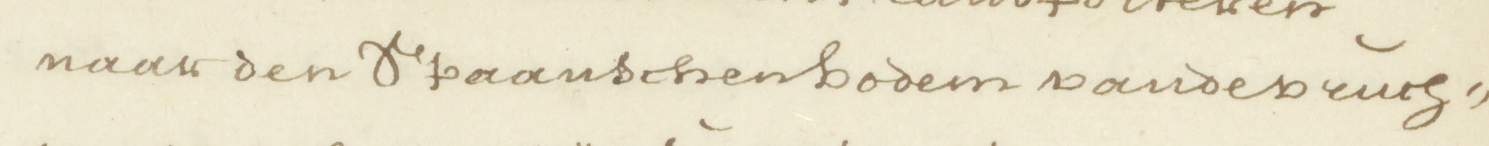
naar den Spaanschen bodem vande vruch„
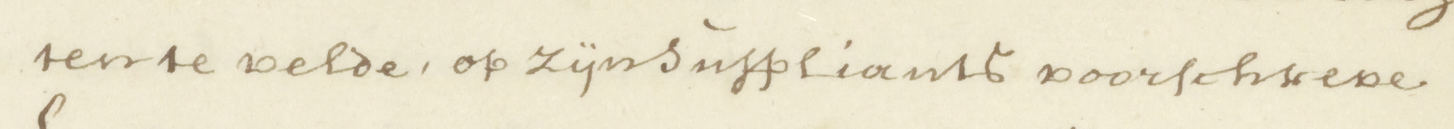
ten te velde, op zijn suppliants voorschreve
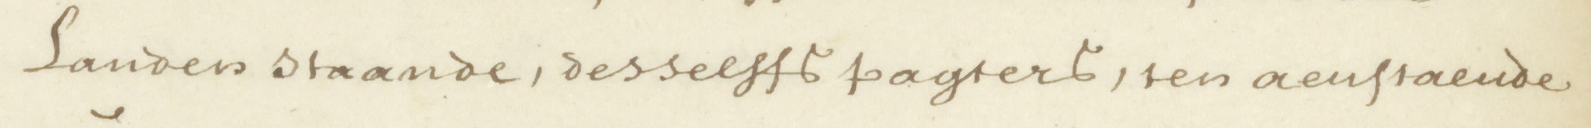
Landen staande, desselffs pagters, ten aenstaende
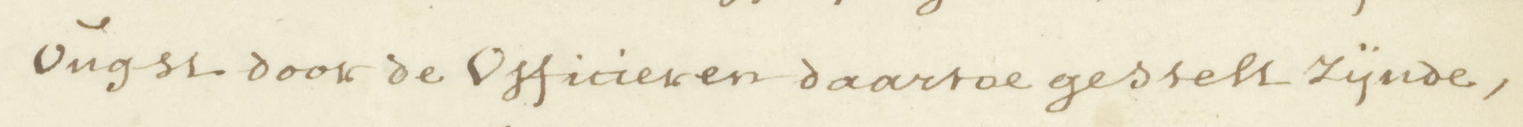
ougst door de Officieren daartoe gestelt zijnde,
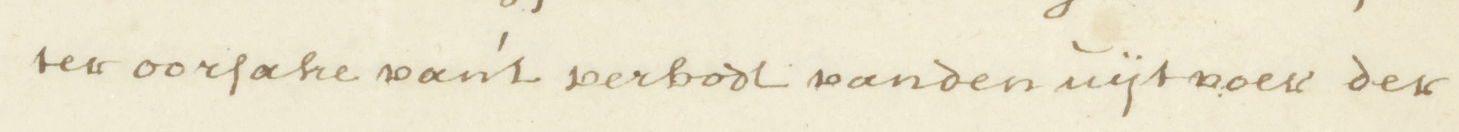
ter oorsake van 't verbodt vanden uijtvoer der
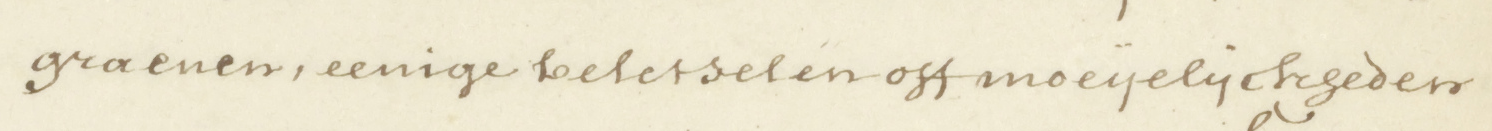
graenen, eenige beletselen off moeijelijckheden
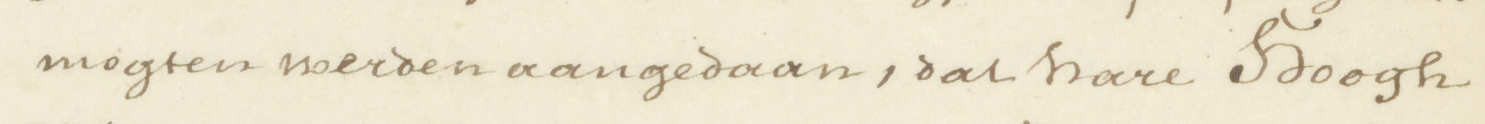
mogten werden aangedaan, dat hare Hoogh
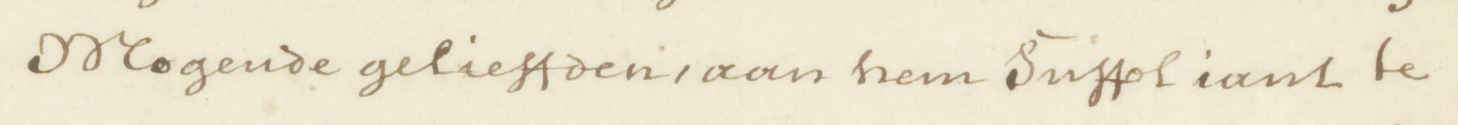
Mogende gelieffden, aan hem suppliant te
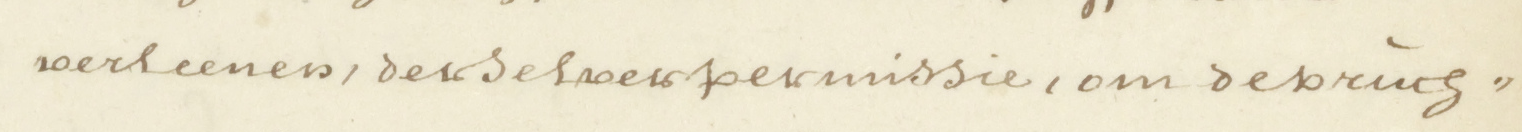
verleenen, derselver permissie, om de vruch„
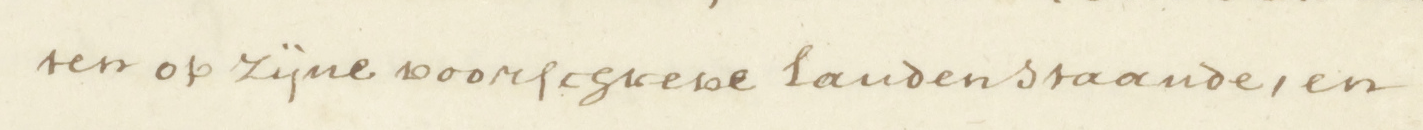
ten op zijne voorschreve landen staande, en
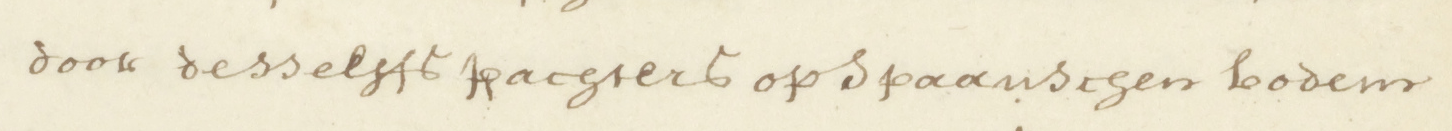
door desselffs pachters op spaanschen bodem
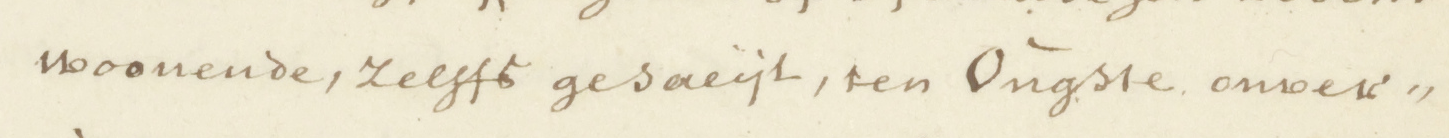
woonende, zelffs gesaeijt, ten Ougste onver„
